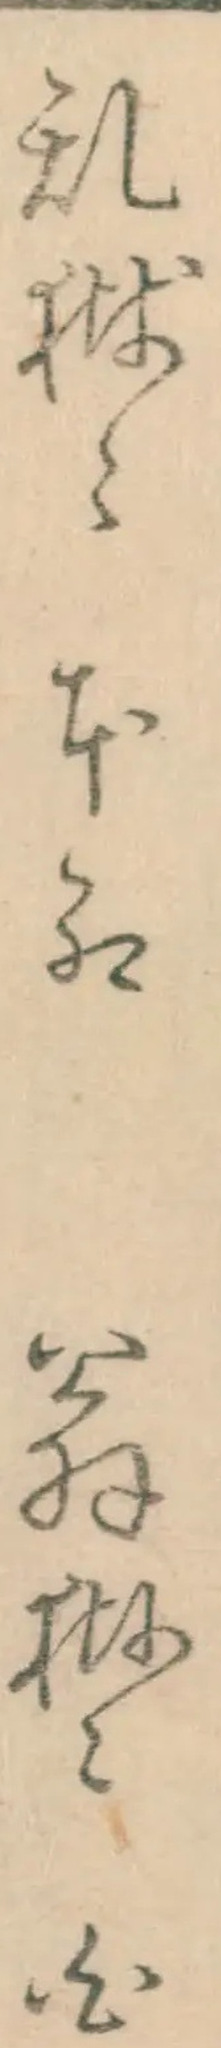乱獅々本花翁獅々図
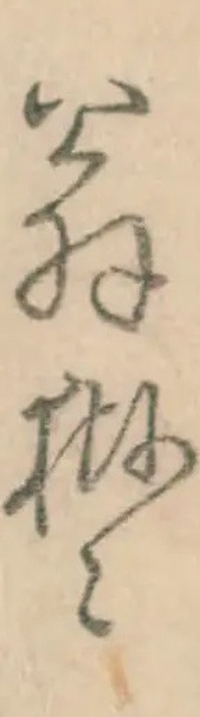乱獅々
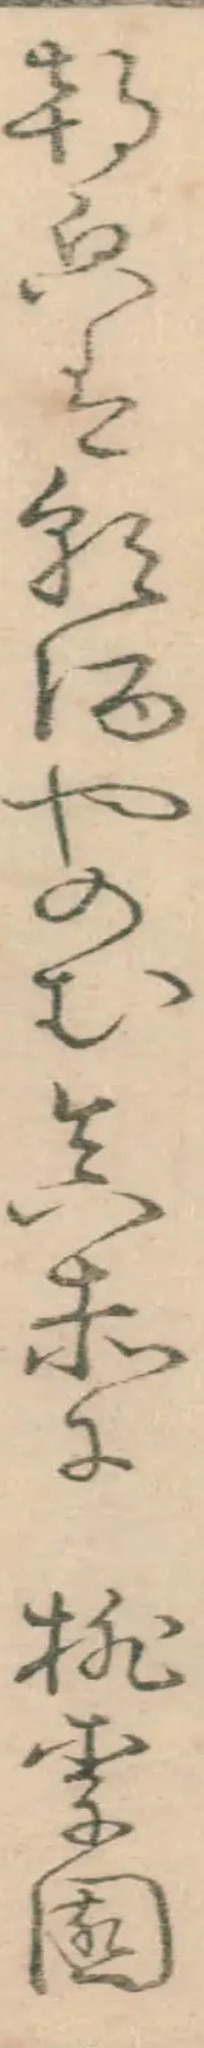朝貌は朝酒やのむ真赤に桃李園
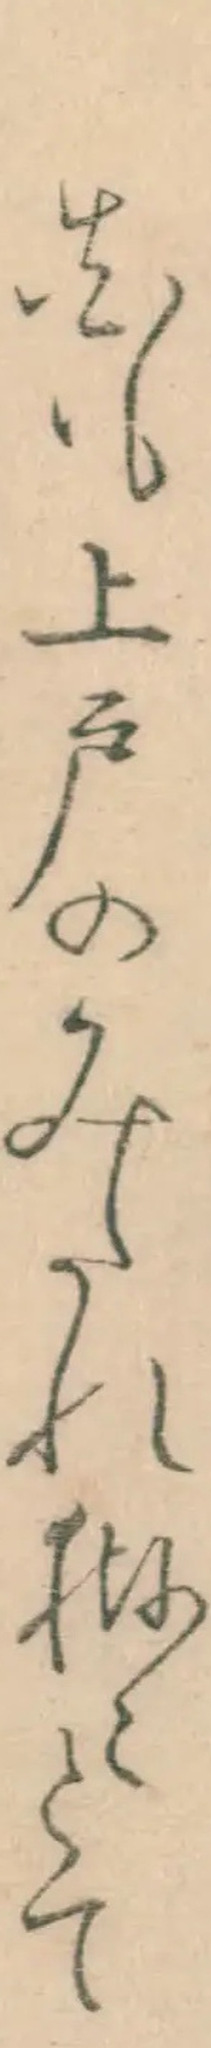花も上戸のみたれ獅々とて
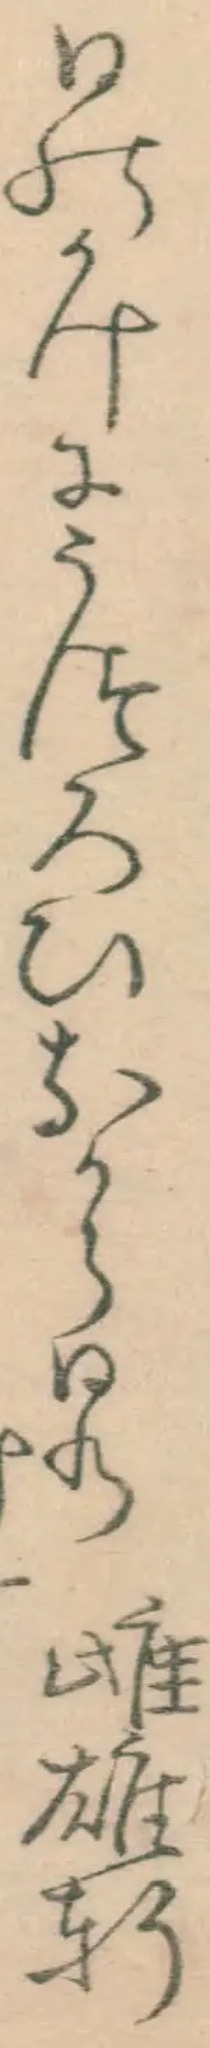日のかけにうつろひなから日の雌雄軒
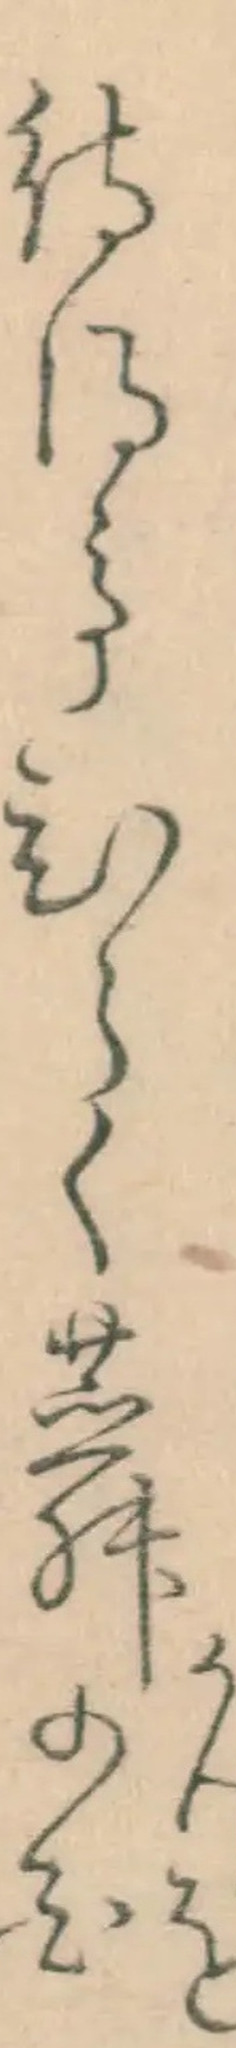待得てひらく芯舞の花
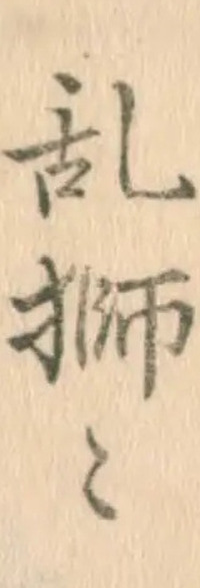乱獅々

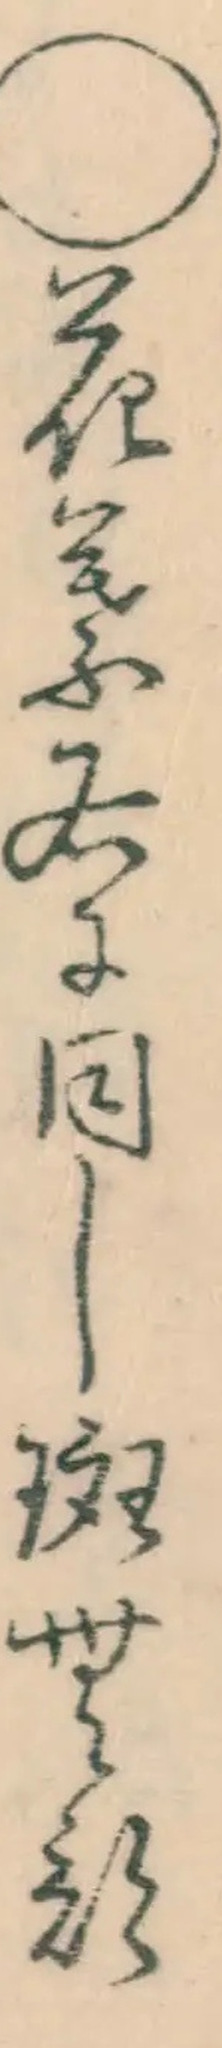○花葉右に同し斑無部
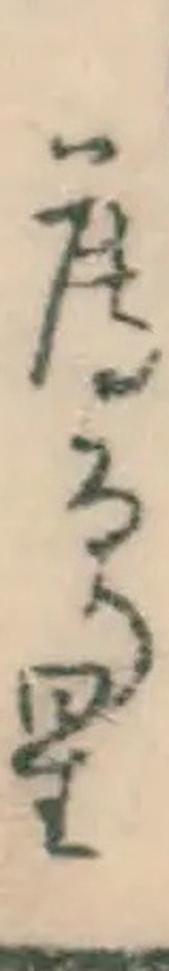薄るり星
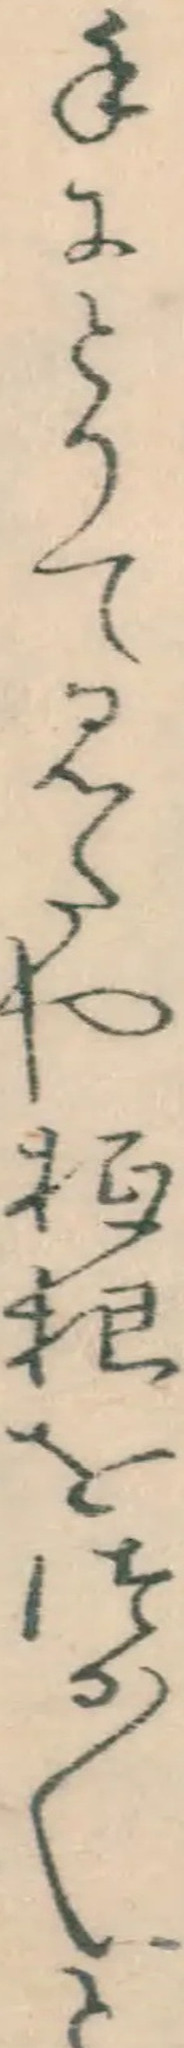手にとりて見たや垣根をする〳〵と

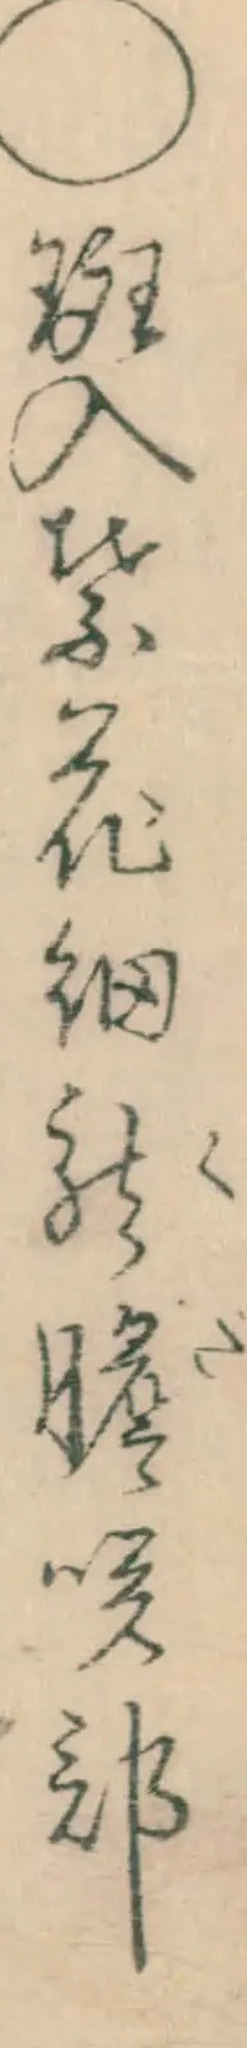○斑入葉花細躯膽咲部
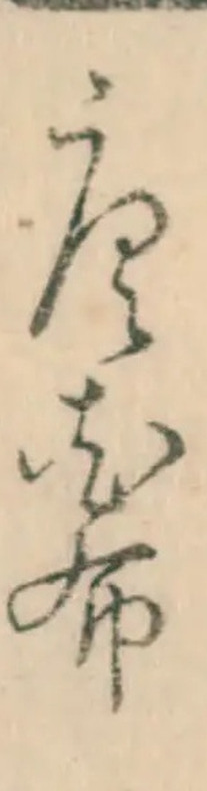唐花布
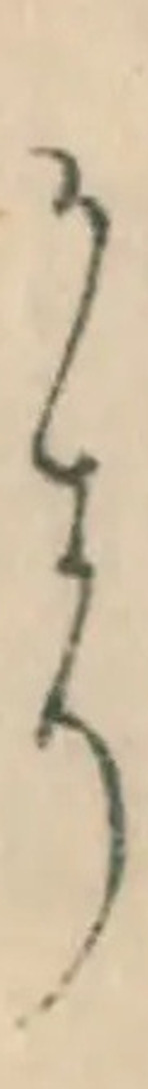かすり
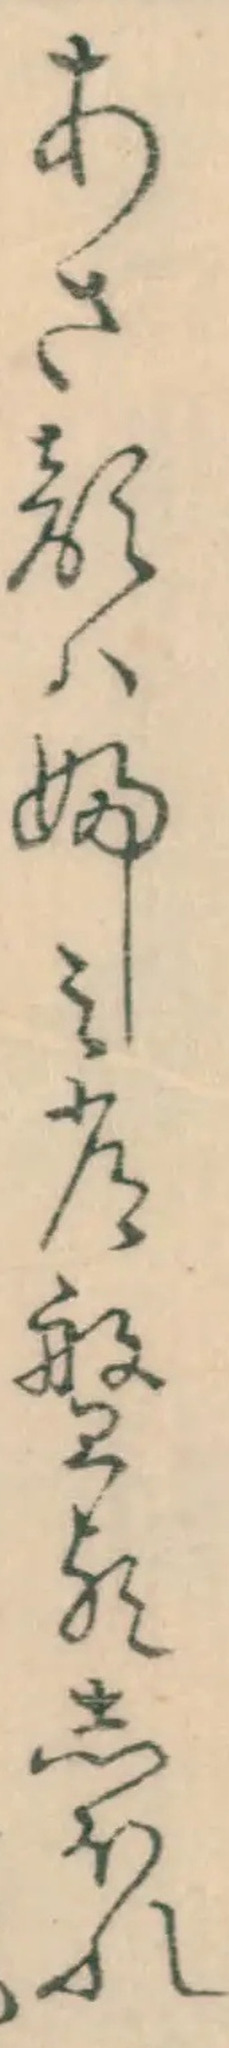あさ顔はふみたはきしほれ
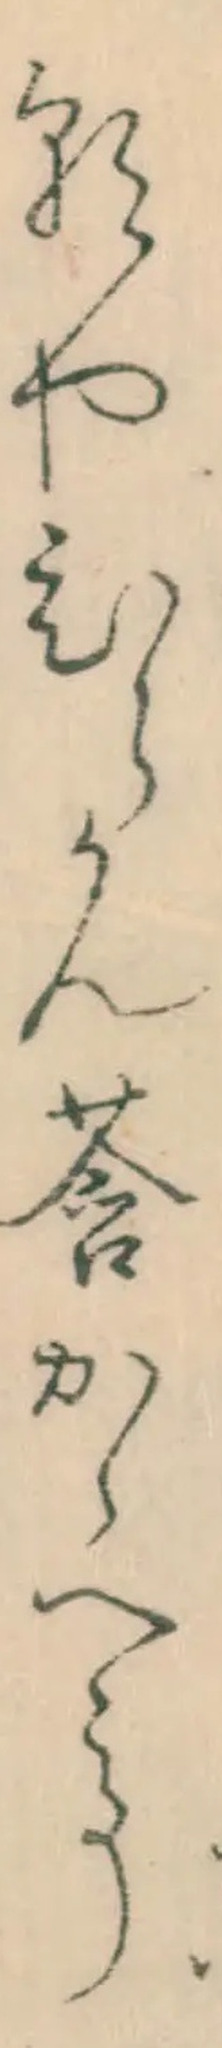朝やひらかん莟かゝへて
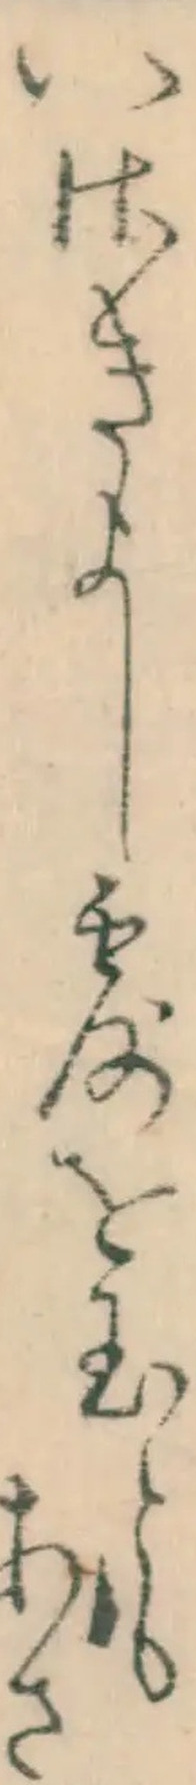いさきよし露を玉とも
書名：花壇朝顔通 2巻. [2]
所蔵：国立国会図書館 National Diet Library, JAPAN
